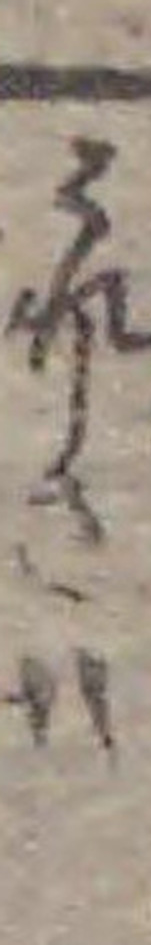うれしさ
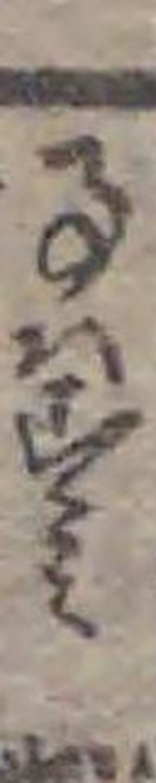事はすみ
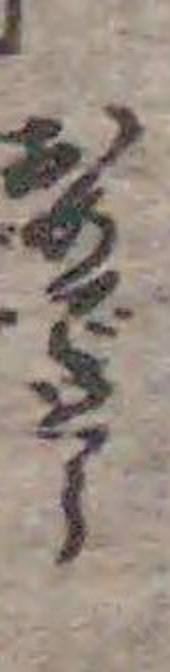おめでとう
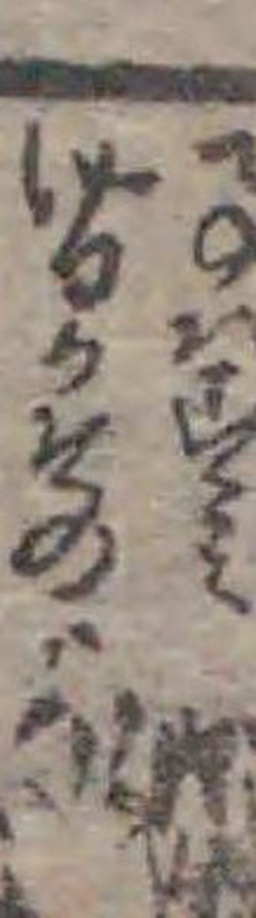けるかその
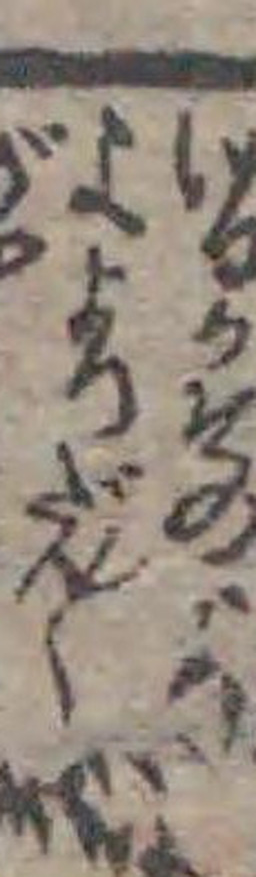よよりだん〳〵
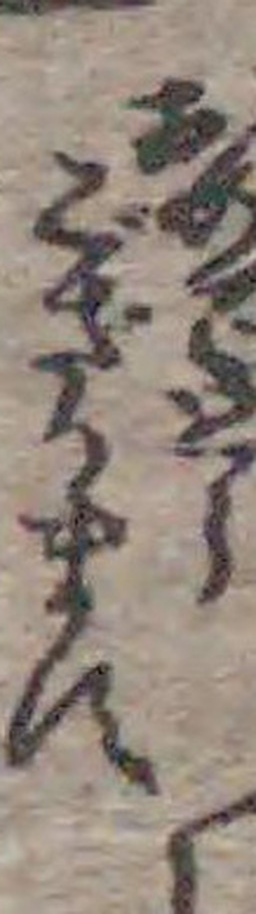ござります
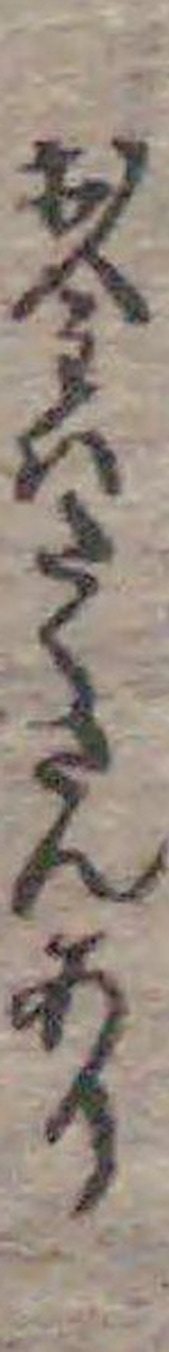お金はたくさんあり
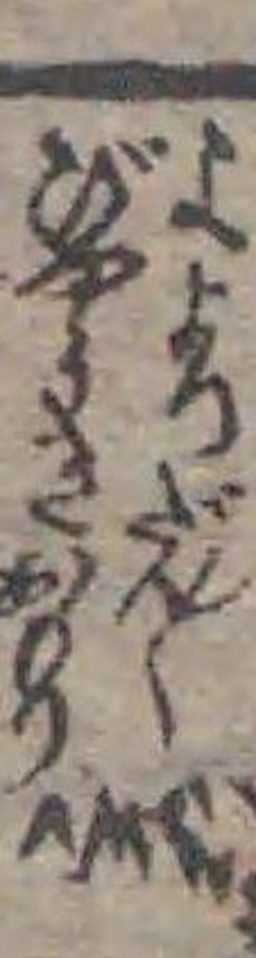びやうきおもり
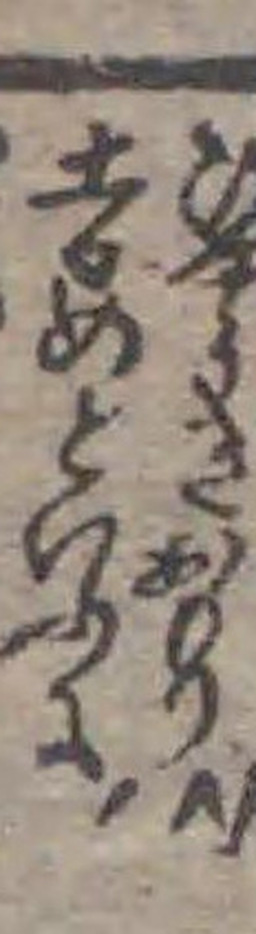十一日めといふに
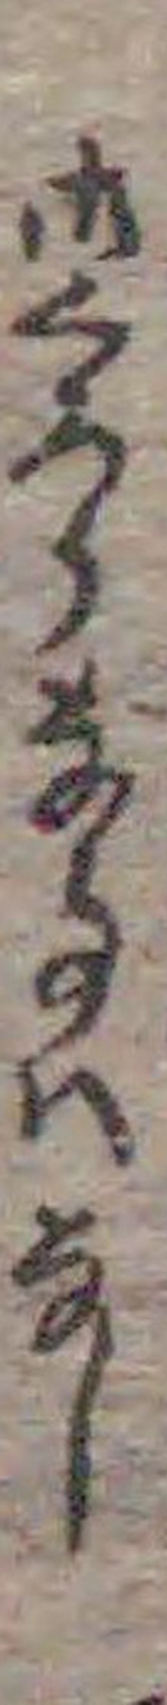御くろうな事はなし
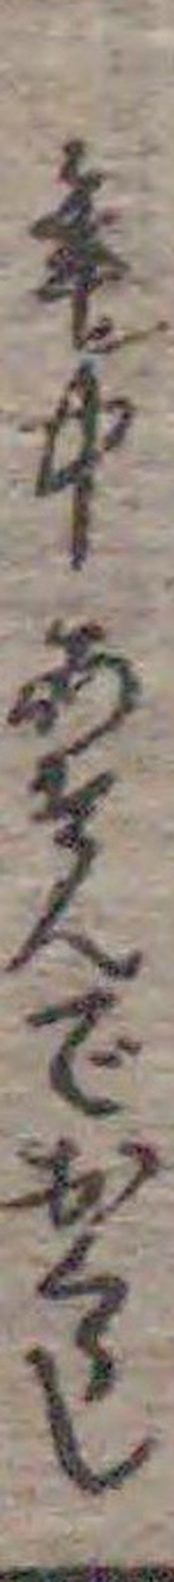年ン中あそんでおくらし
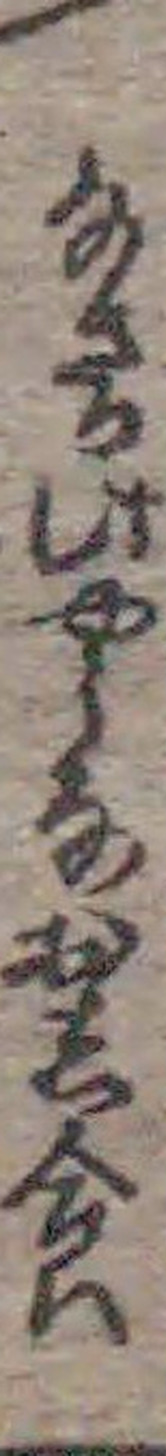なさり此ようなおし合は
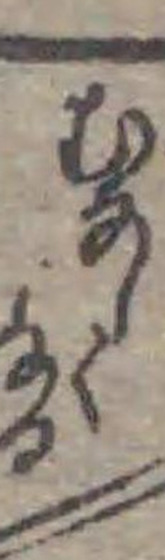むなしく
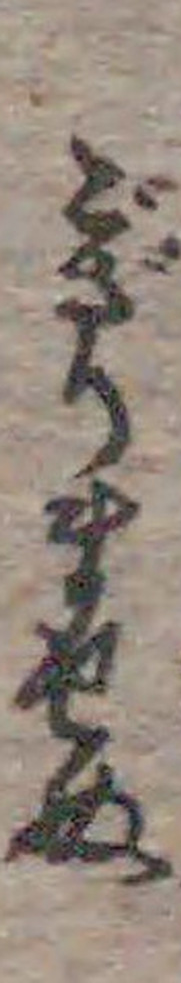ござりませぬ
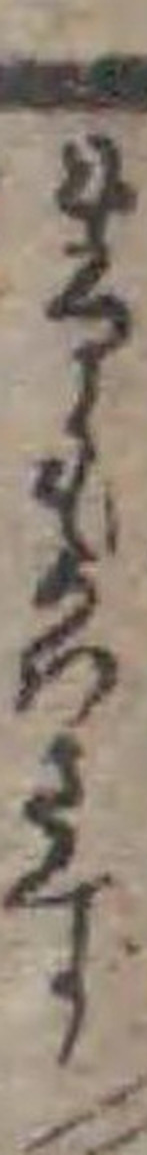まくらもかはさす
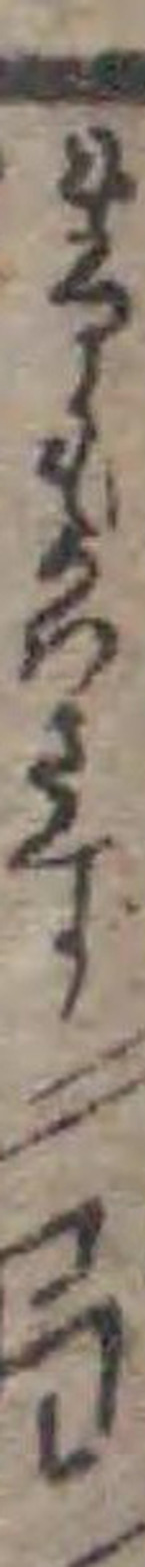まくらもかはさす
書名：見徳一炊夢 : 3巻
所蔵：国立国会図書館 National Diet Library, JAPAN
